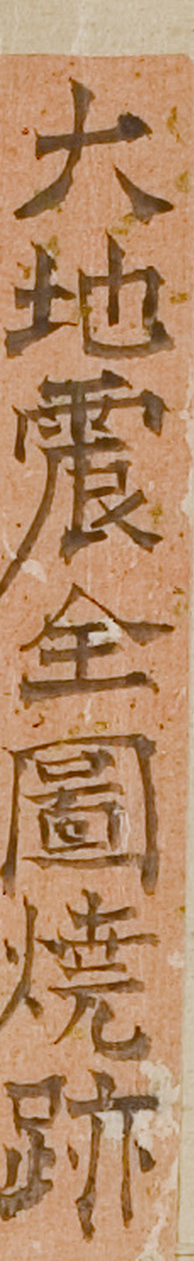大地震全図焼跡
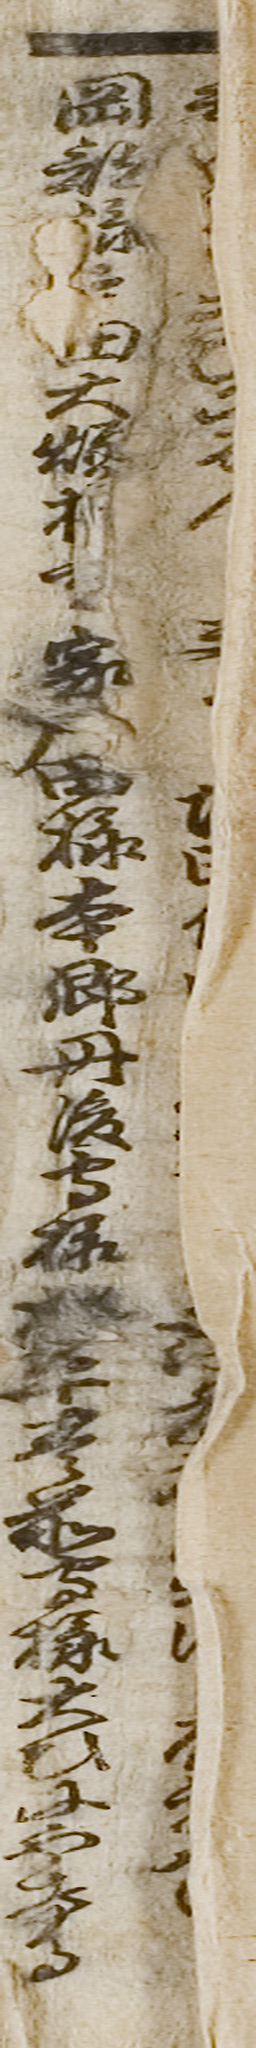岡部様戸田大炊様家戸田様本郷丹後守様松平豊前守様大ひにやける
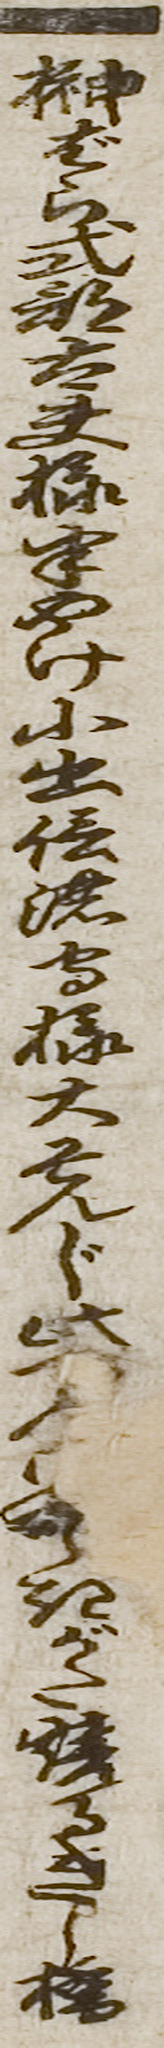榊ばら式部太夫様半やけ小出信濃守様大そんじ此へやしきがた焼るきし橋
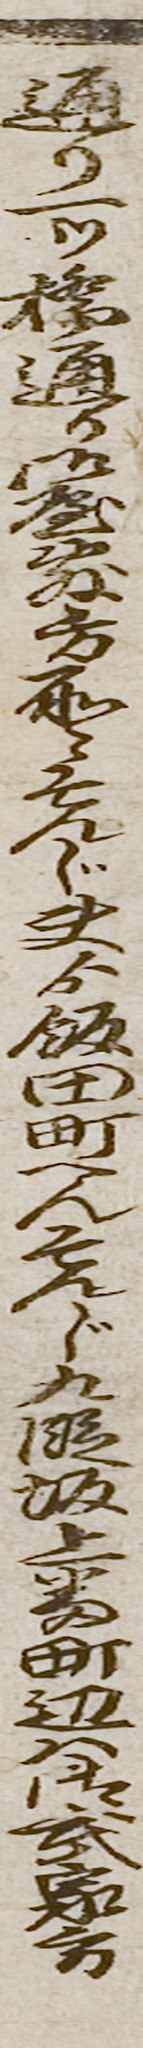通り一つ橋通り御屋敷方所々そんじ夫より飯田町へんそんじ九段坂上番町辺は御武家方
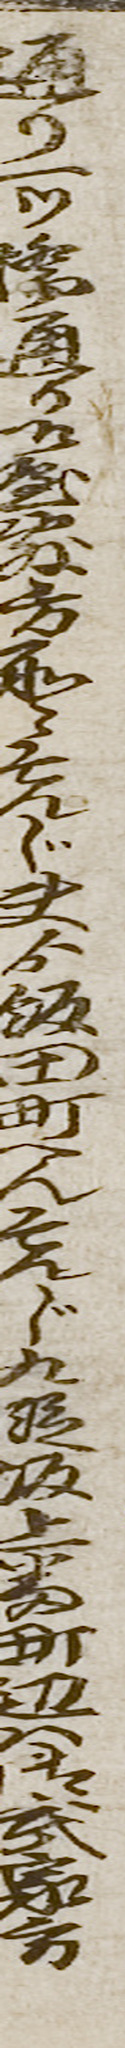通り一つ橋通り御屋敷方所々そんじ夫より飯田町へんそんじ九段坂上番町辺は御武家方
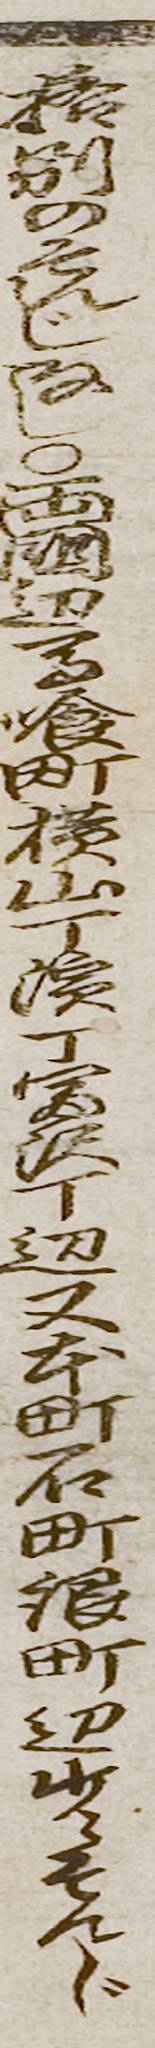格別のそんじなし○領国辺馬喰町横山丁浜丁富沢丁辺又本町石町銀町辺少々そんじ
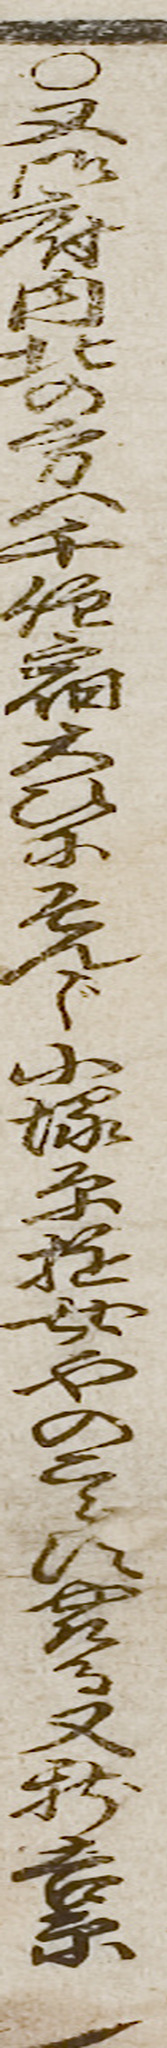○又御府内北の方へ千住宿大ひにそんじ小塚原遊女やのこらすやける又新吉原
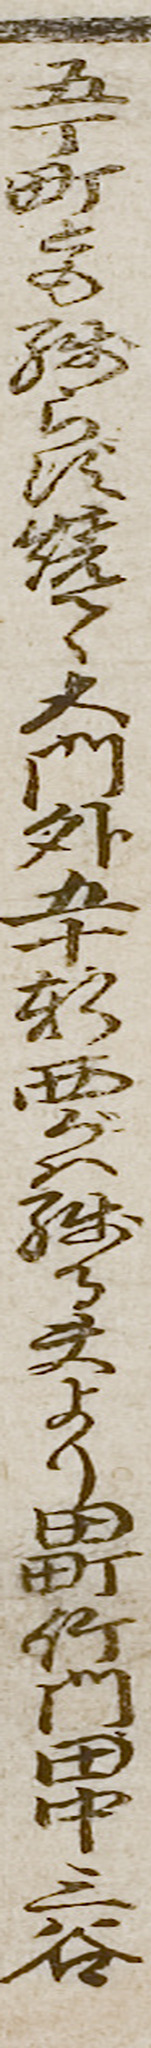五丁町とも残らず焼て大門外五十軒西かハ残る夫より田町竹門田中三谷
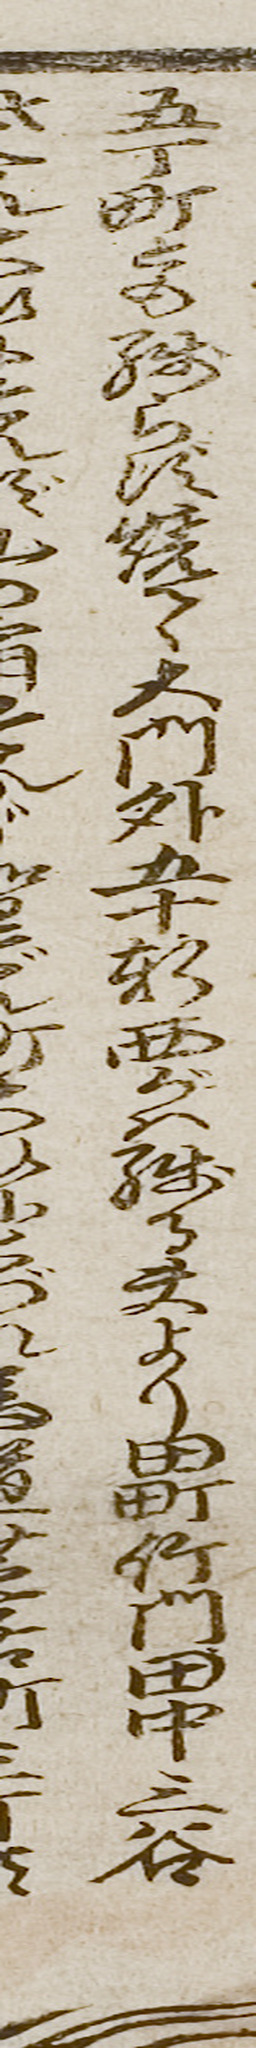此へん大ひにそんず山の宿そんじ聖でん町大ひにくづれ馬道芝居町三丁共
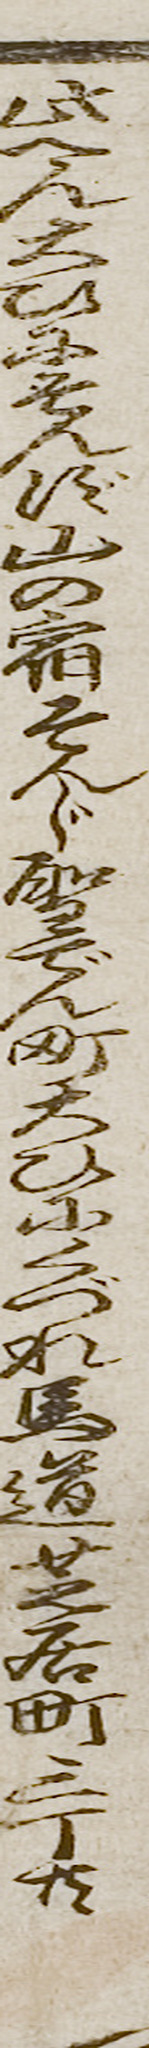此へん大ひにそんず山の宿そんじ聖でん町大ひにくづれ馬道芝居町三丁共
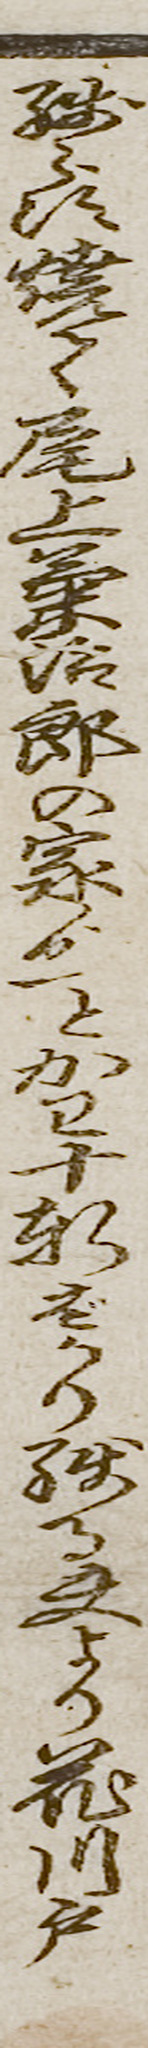残らす焼て尾上菊治郎の家より一とかセ十軒ばかり残る夫より花川戸
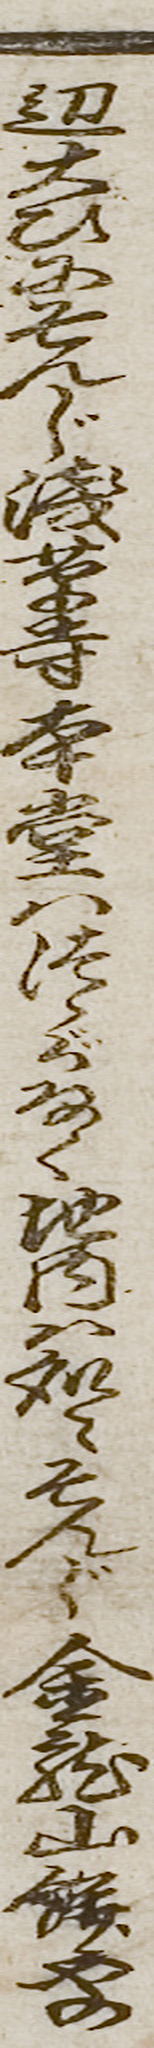辺大ひにそんじ浅草本堂ハつゝがなく地内は処々そんじ金龍山餅やの
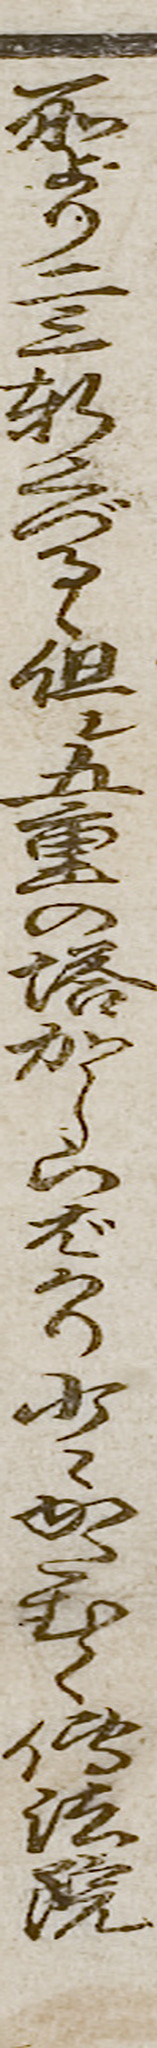所より二三軒くづるゝ但し五重の塔かしらばかり少々かたむく伝法院
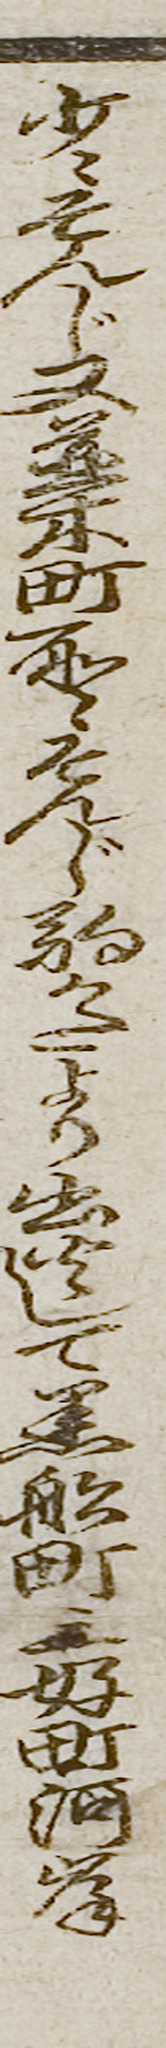少々そんじ又並木町所々そんじ駒かたより出火して黒船町三好町河岸
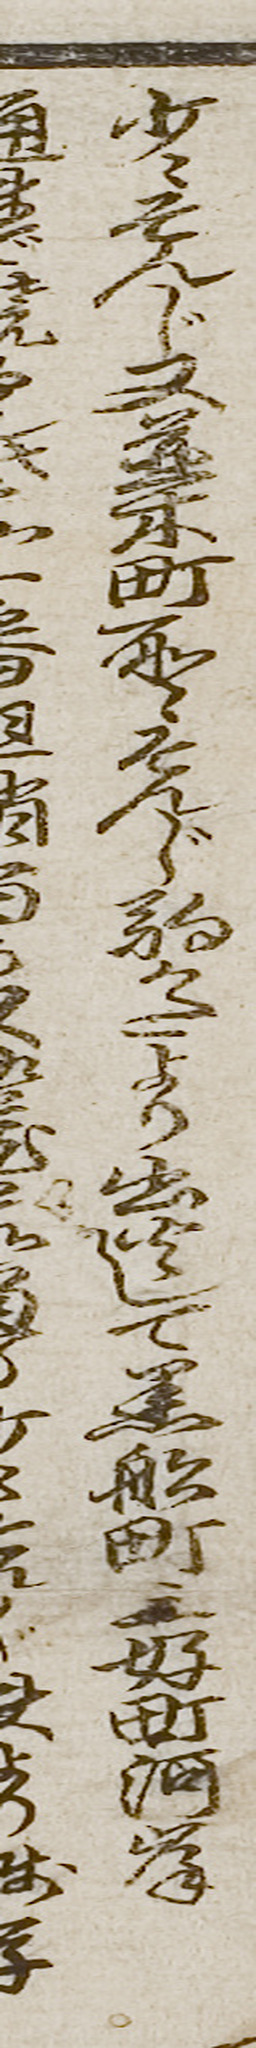通まで焼る也此所一番組消留る又御蔵前通り少々そんじ夫より浅草
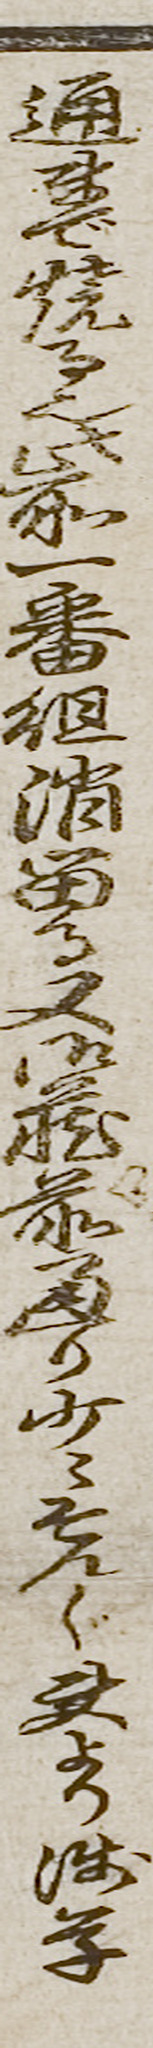通まで焼る也此所一番組消留る又御蔵前通り少々そんじ夫より浅草
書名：江戸大地震出火場所分
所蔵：東京大学総合図書館 General Library in the University of Tokyo, JAPAN
